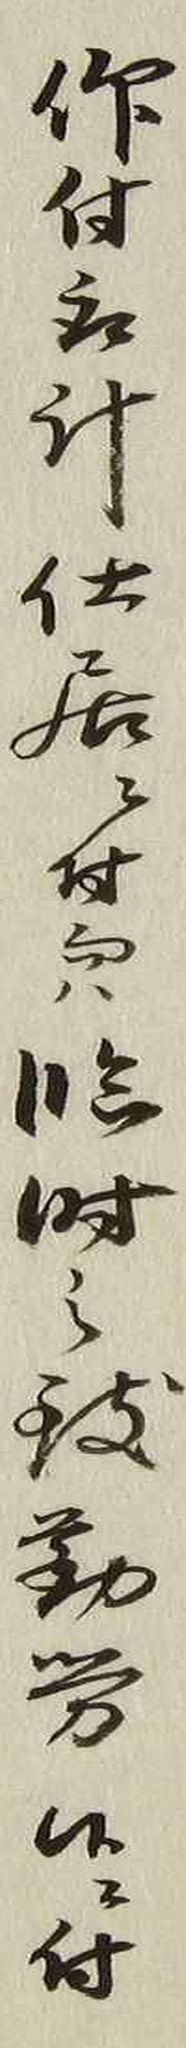仰付取計仕居に付而は臨時之致勤労候に付
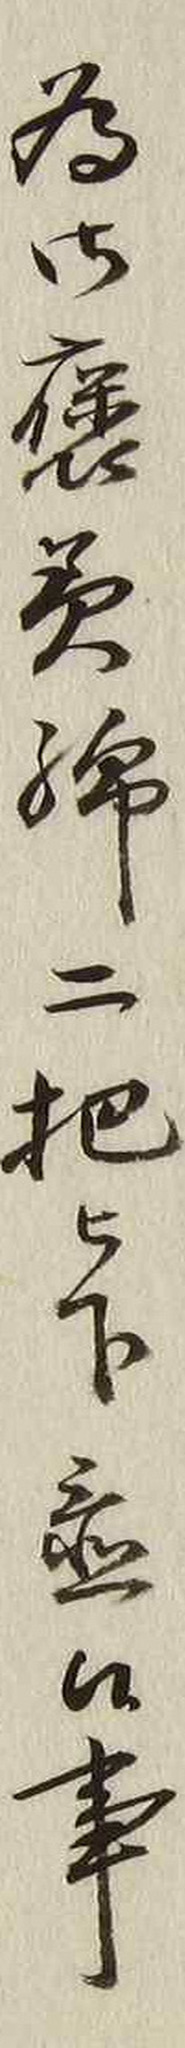為御褒美綿二把被下置候事
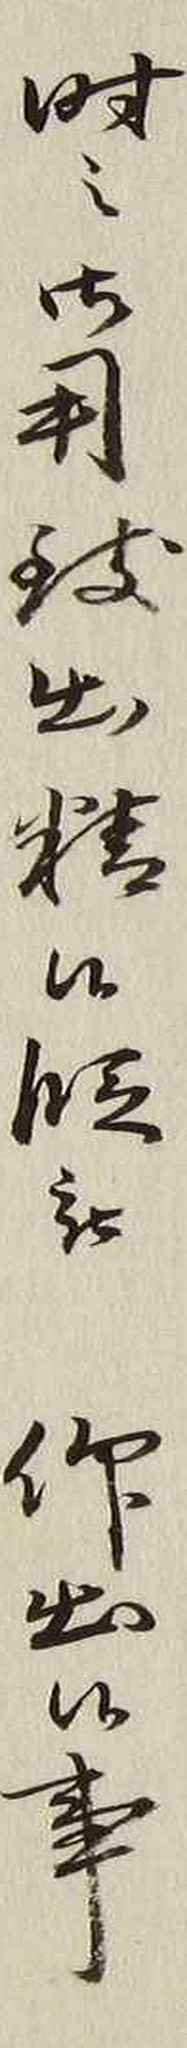時之御用致出精候段被仰出候事
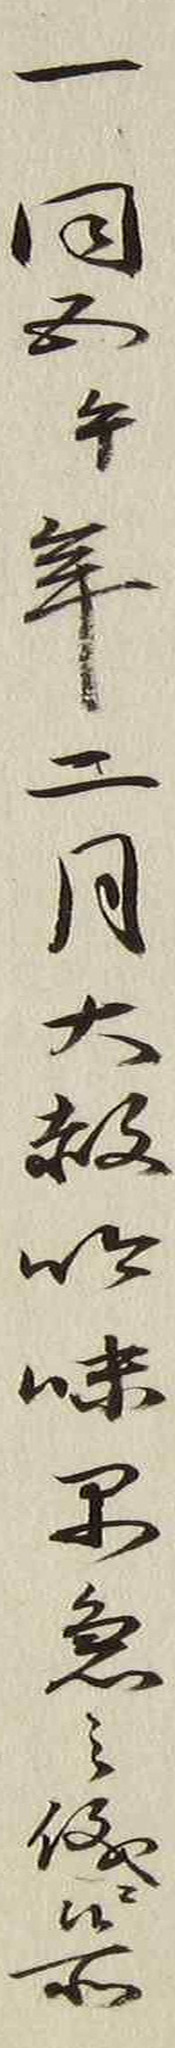一同五年午年二月大数吟味急之儀に候所
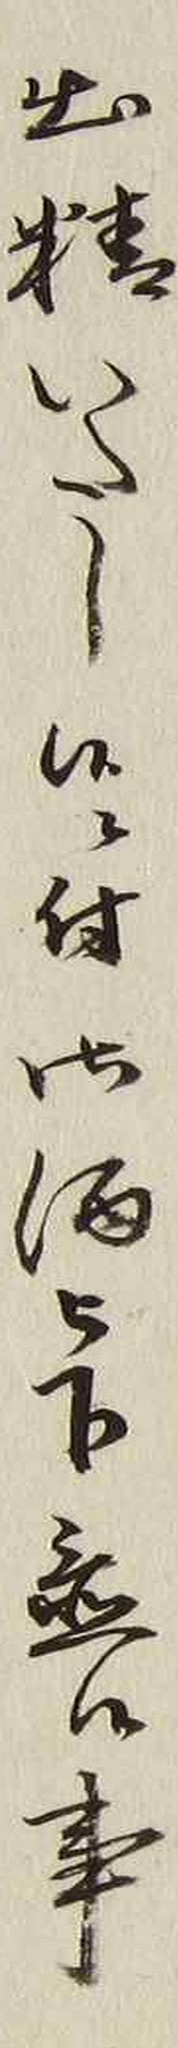出精いたし候に付御酒被下置候事
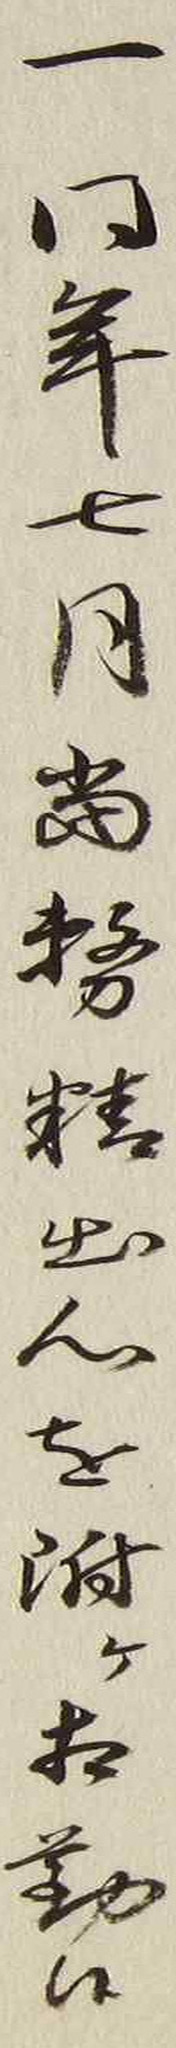一同年七月当務精出心を附ケ相勤候
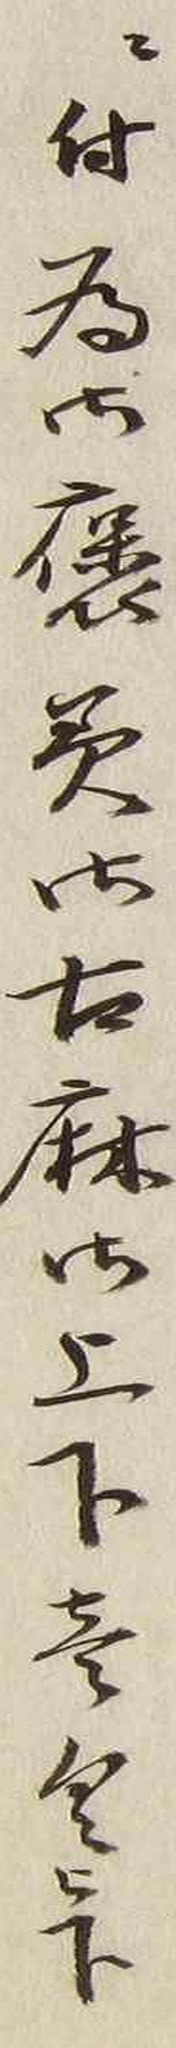に付為御褒美御古麻御上下一具被下
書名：諸士系譜　巻之160　な之部2
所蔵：会津若松市立会津図書館
